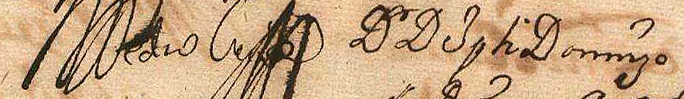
Pedro Curiel Dor D Iph Domingo
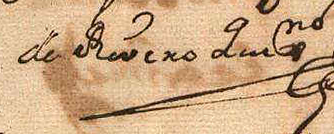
de Rivero Quixno
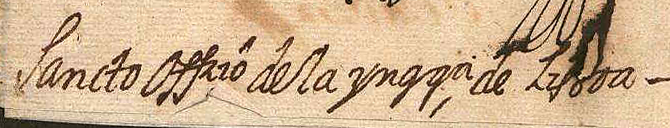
Sancto Off.zio dela ynqq.a de Lisvoa
